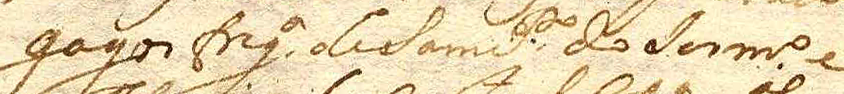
gagos freg.a de Sam P.o do Ierm.o e
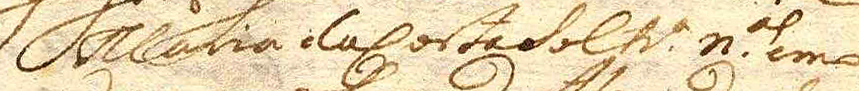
Maria da Costa Soltr.a n.al e mo
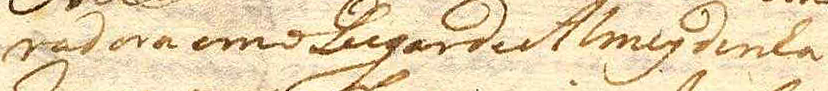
radora em o Lugar de Almeydinha
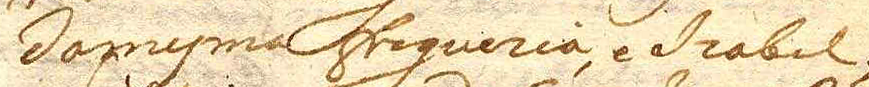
da mesma freguezia, e Izabel
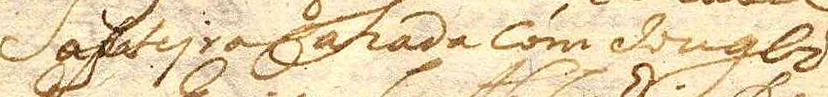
Sapatejra Cazada com Ioze glz̄
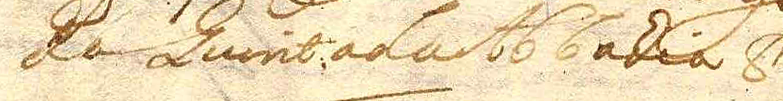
da Quinta da Abbadia fre
